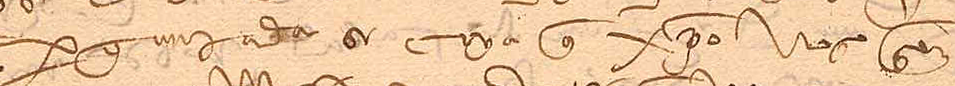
ꝑguntada se crya q̄ xp̄o Noso s̄or
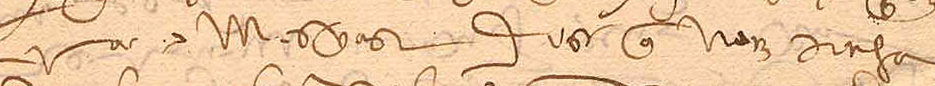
era o Mesyas dise q̄ nom tinha
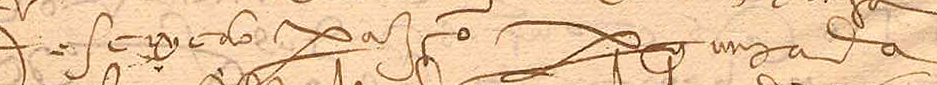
descryção ꝑa Jso ꝑguntada
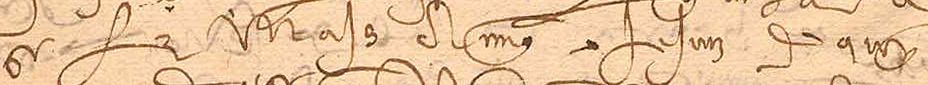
se fez maJs Annꝯ o JeJum do quy
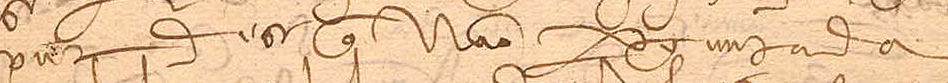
pur dise q̄ Não ꝑguntada
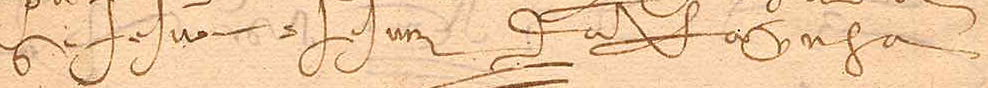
se JeJuou o JeJum da Raynha
